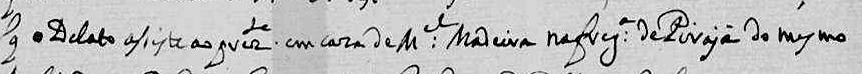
q̄ o Delato assiste ao prez.te em caza de Me:l Madeira na freg:a de Piraja do mesmo
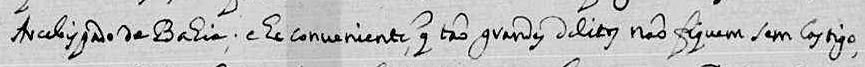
Arcebispado da Bahia; e he conueniente, q̄ taõ grandes delitos naõ fiquem sem castigo,
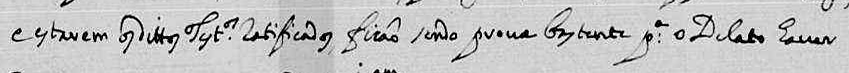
e estarem os dittos Test.os Ratificados, ficaõ sendo proua bastante p:a o Delato hauer
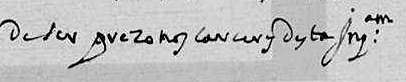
de ser prezo nos carceres desta Jnq:am
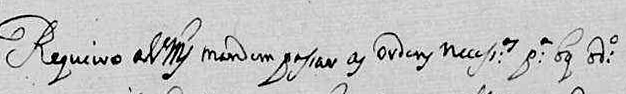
Requeiro a V Ms̄ mandem passar as ordens necess:as p:a o q̄ o d:o
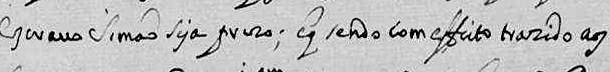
escrauo Simão seja prezo; e q̄ sendo com effeito trazido aos
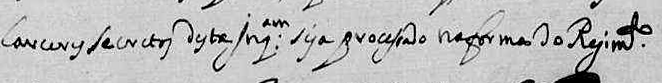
Carceres Secretos desta Jnq:am seja processado na forma do Regim.to
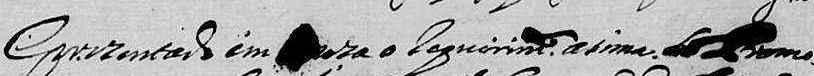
E prezentado em _eza o Requirim.to asima do Promo
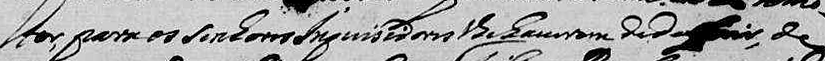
tor, para os senhores Inquisidores lhe hauerem de deferir, de
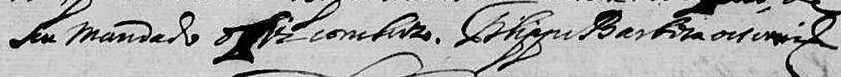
seu mandado o fiz concluzo. Filippe Barboza o escreuj
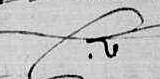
C.lo
